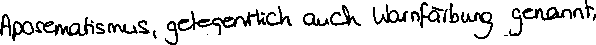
Aposematismus, gelegentlich auch Warnfärbung genannt,
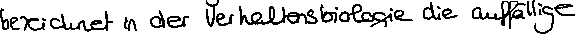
bezeichnet in der Verhaltensbiologie die auffällige
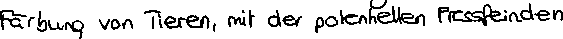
Färbung von Tieren, mit der potentiellen Fressfeinden
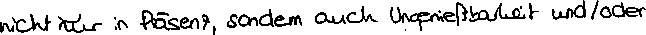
nicht nur Präsenz, sondern auch Ungenießbarkeit und/oder
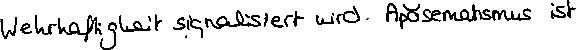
Wehrhaftigkeit signalisiert wird. Aposematismus ist
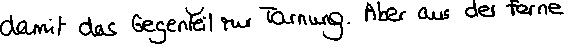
damit das Gegenteil der Tarnung. Aber aus der Ferne
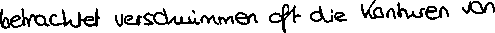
betrachtet verschwimmen oft die Konturen von
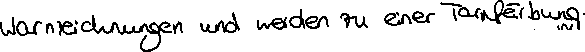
Warnzeichnungen und werden zu einer Tarnfärbung.
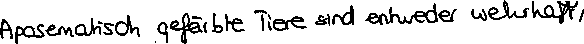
Aposematisch gefärbte Tiere sind entweder wehrhaft,
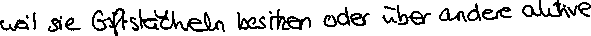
weil sie Giftstacheln besitzen oder über andere aktive
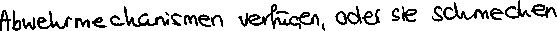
Abwehrmechanismen verfügen, oder sie schmecken
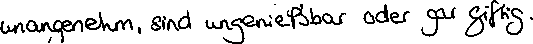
unangenehm, sind ungenießbar oder gar giftig.
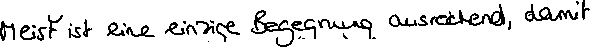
Meist ist eine einzige Begegnung ausreichend, damit
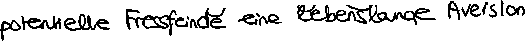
potentielle Fressfeinde eine lebenslange Aversion
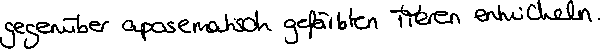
gegenüber aposematisch gefärbten Tieren entwickeln.
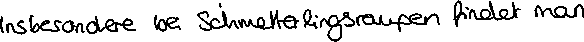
Insbesondere bei Schmetterlingsraupen findet man
